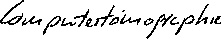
Computertomographie
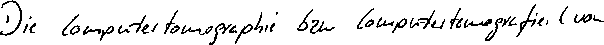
Die Computertomographie bzw. Computertomografie (von
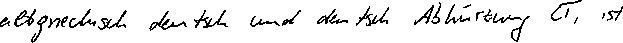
altgriechisch deutsch und deutsch Abkürzung CT, ist
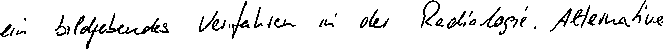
ein bildgebendes Verfahren in der Radiologie. Alternative
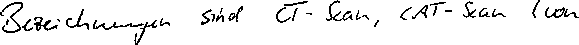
Bezeichnungen sind CT-Scan, CAT-Scan (von
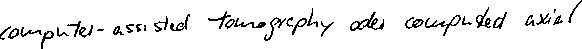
computer-assisted tomography oder computed axial
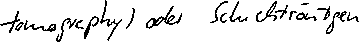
tomography) oder Schichtröntgen
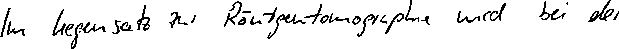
Im Gegensatz zur Röntgentomographie wird bei der
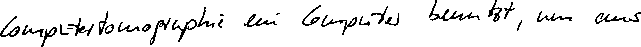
Computertomographie ein Computer benutzt, um aus
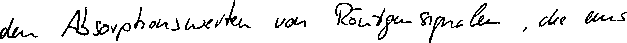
den Absorptionswerten von Röntgensignalen, die aus
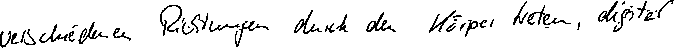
verschiedenen Richtungen durch den Körper treten, digital
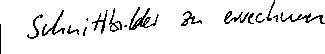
Schnittbilder zu errechnen.
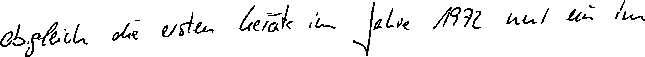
Obgleich die ersten Geräte im Jahre 1972 nur eine im
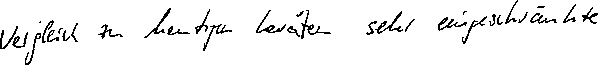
Vergleich zu heutigen Geräten sehr eingeschränkte
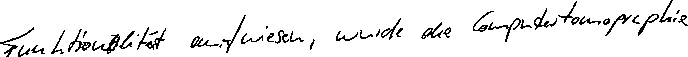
Funktionalität aufwiesen, wurde die Computertomographie
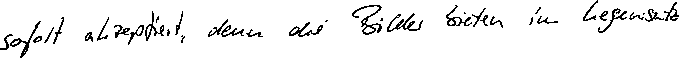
sofort akzeptiert, denn die Bilder bieten im Gegensatz
